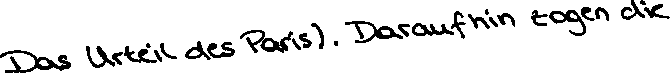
Das Urteil des Paris). Daraufhin zogen die
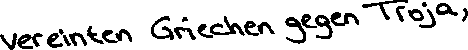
vereinten Griechen gegen Troja,
